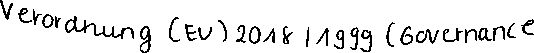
Verordnung (EU) 2018/1999 (Governance
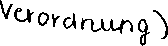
Verordnung)
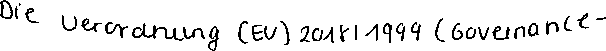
Die Verordnung (EU) 2018/1999 (Governance-
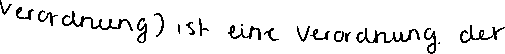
Verordnung) ist eine Verordnung der
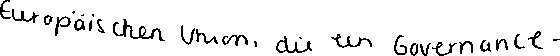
Europäischen Union, die ein Governance-
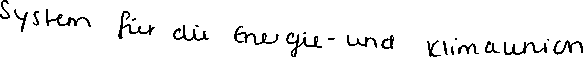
System für die Energie- und Klimaunion
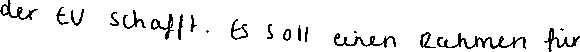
der EU schafft. Es soll einen Rahmen für
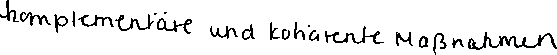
Komplementäre und kohärente Maßnahmen
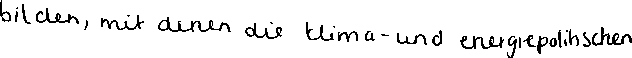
bilden, mit denen die klima- und energiepolitischen
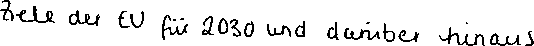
Ziele der EU für 2030 und darüber hinaus
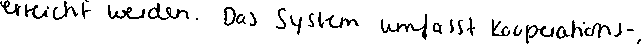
erreicht werden. Das System umfasst Kooperations-,
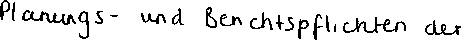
Planungs- und Berichtspflichten der
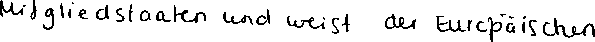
Mitgliedstaaten und weist der Europäischen
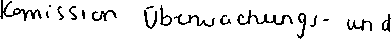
Kommission Überwachungs- und
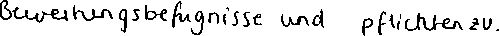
Bewertungsbefugnisse und -pflichten zu.
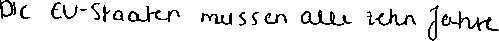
Die EU-Staaten müssen alle zehn Jahre
